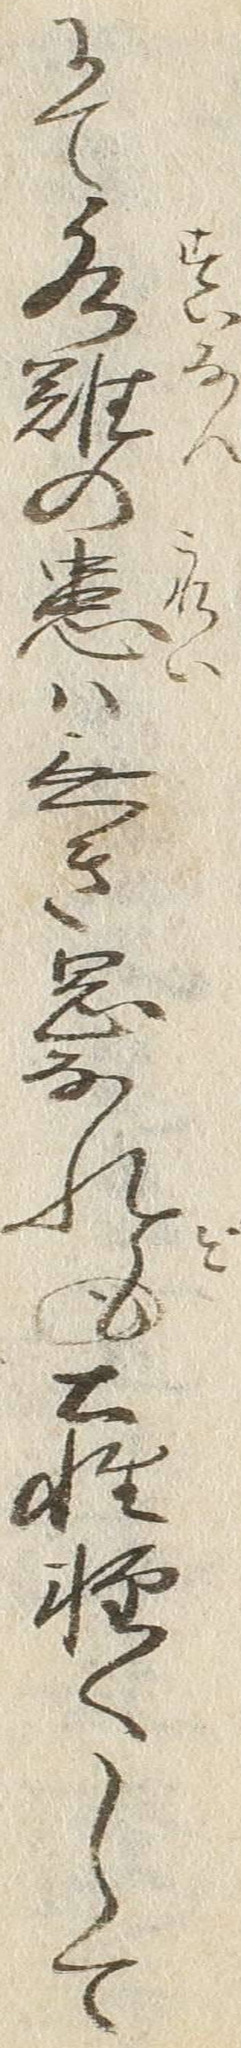尓て水難の患は無き岡なれど土性軽くして
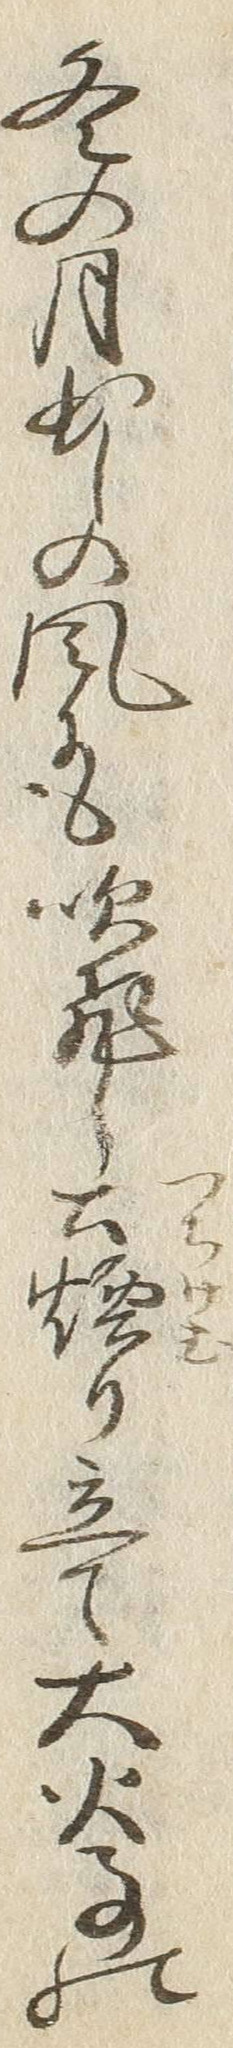冬の月出しの風尓も吹飛し土煙り立て大火事能
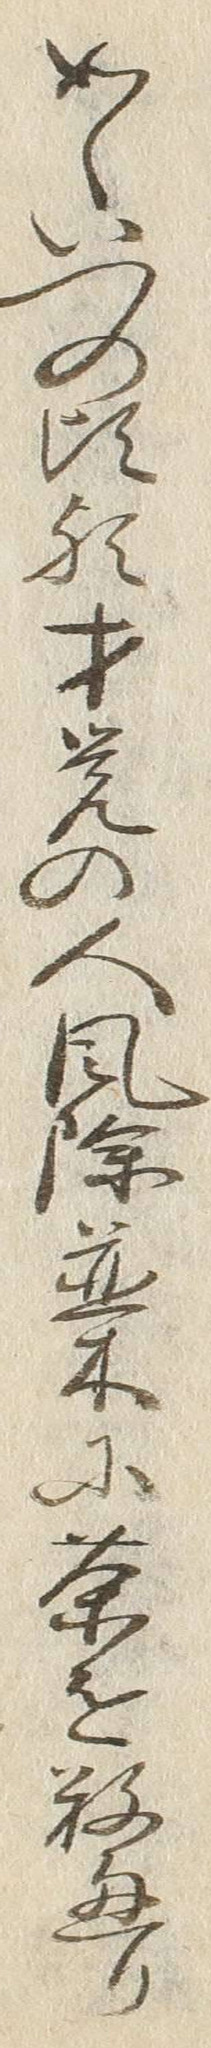如くいつの頃歟才覚の人風除並木尓茶を数通り
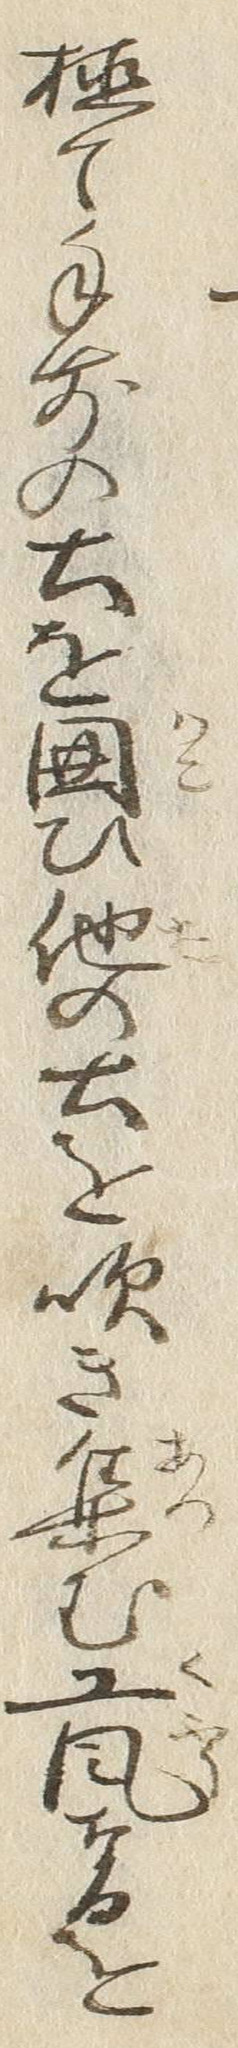植て手前の土を囲ひ他の土を吹き集む工夫なるを
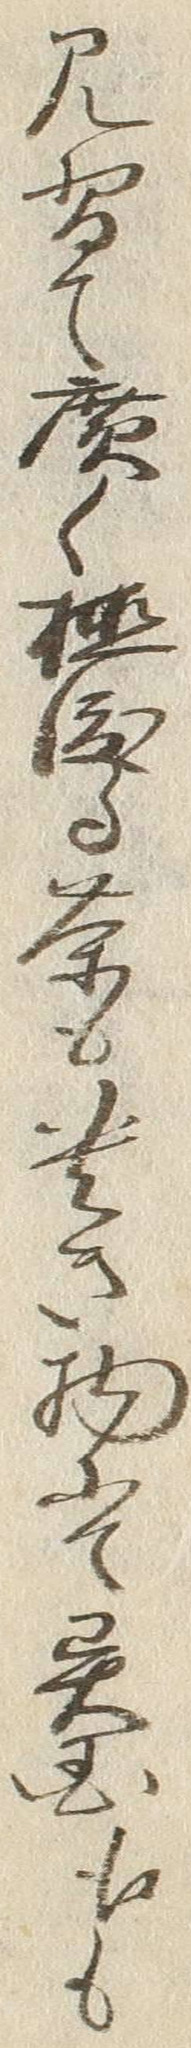見習て廣く植渡る茶も貴き物尓て異國江も
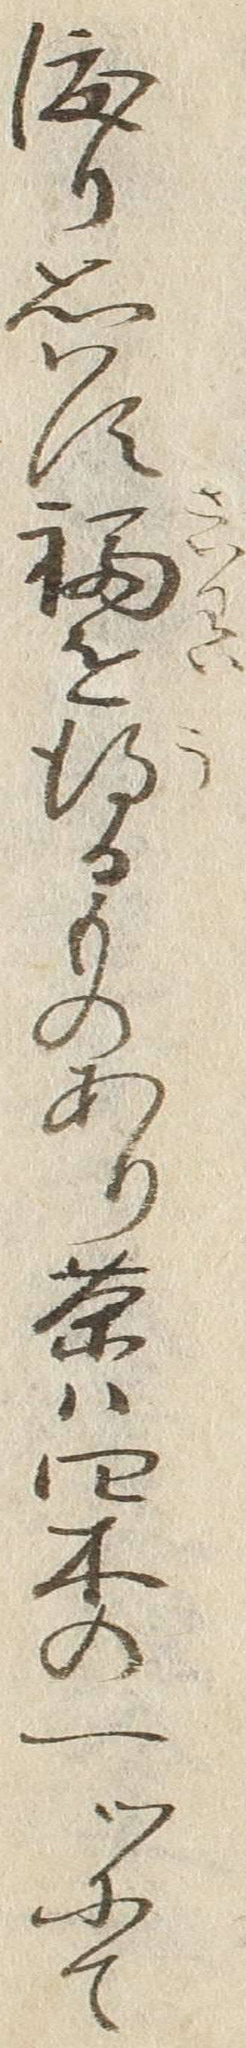渡り思は須福を得るものあり茶は四木の一ツ尓て
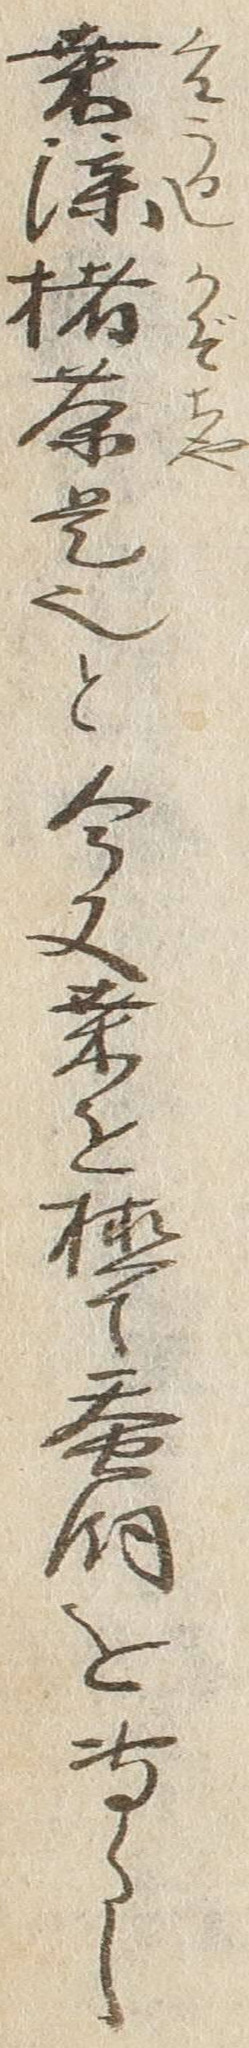桑漆楮茶是也と今又桑を植て蚕飼を専らし

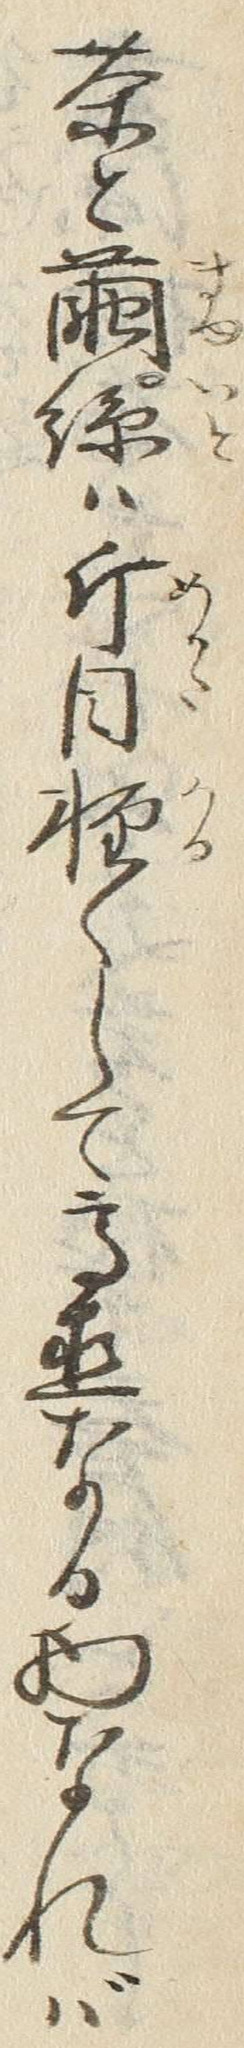茶と繭絲は斤目軽くして高直なる物なれば
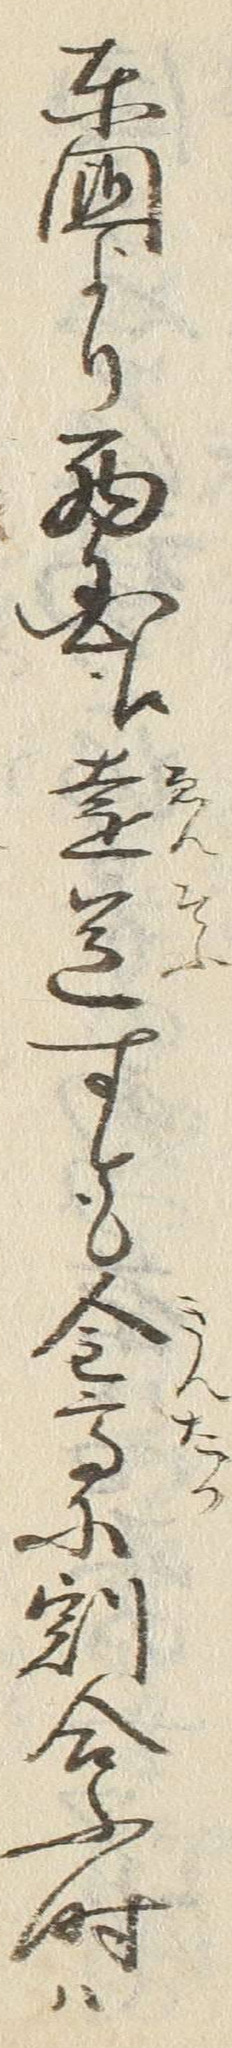東國より西國江遠送すとも金高尓割合ふ時は
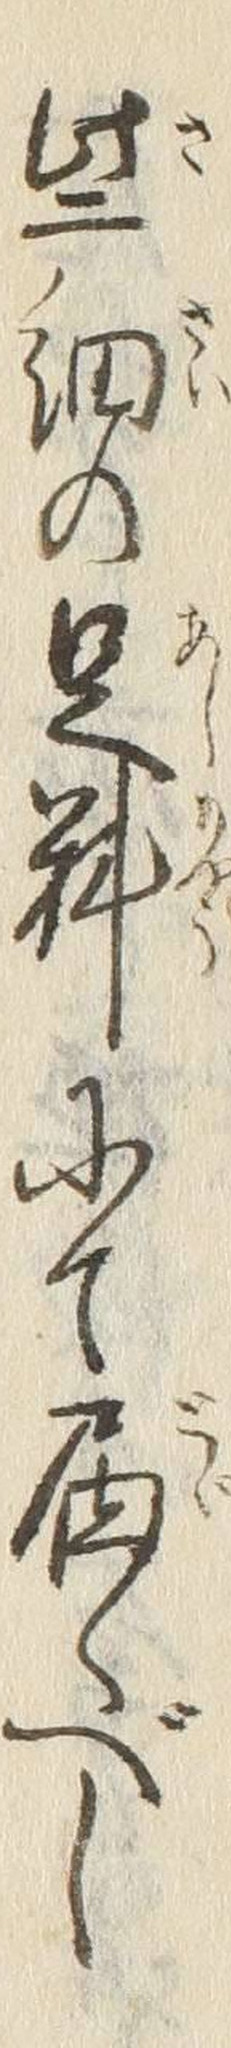些細の足料尓て届くべし
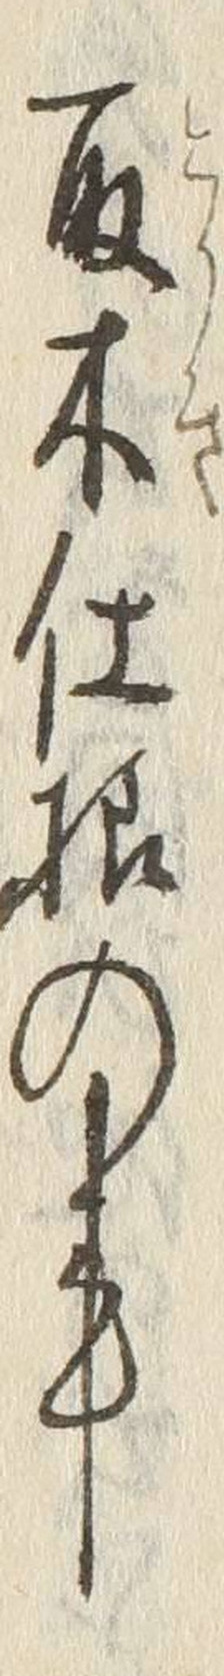取木仕様の事
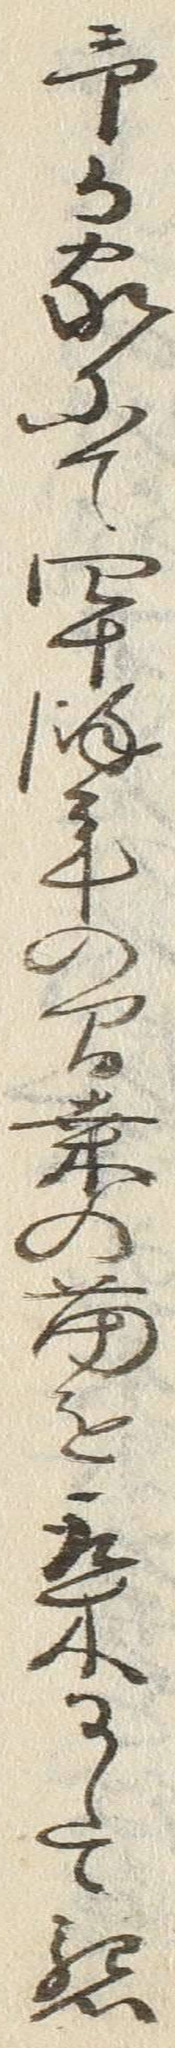予か家尓て四十餘年の間桑の苗を取木尓して懇
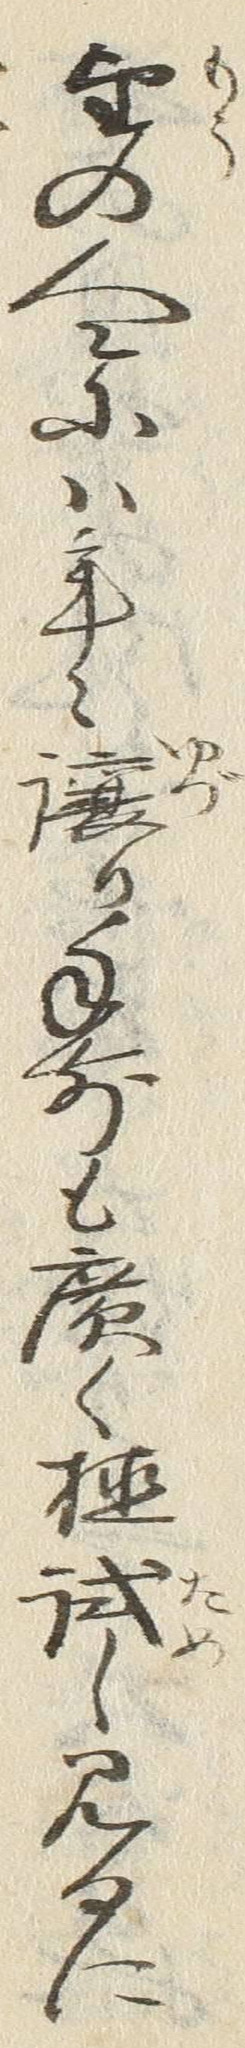望の人々尓は年々譲り手前も廣く植試し見るに
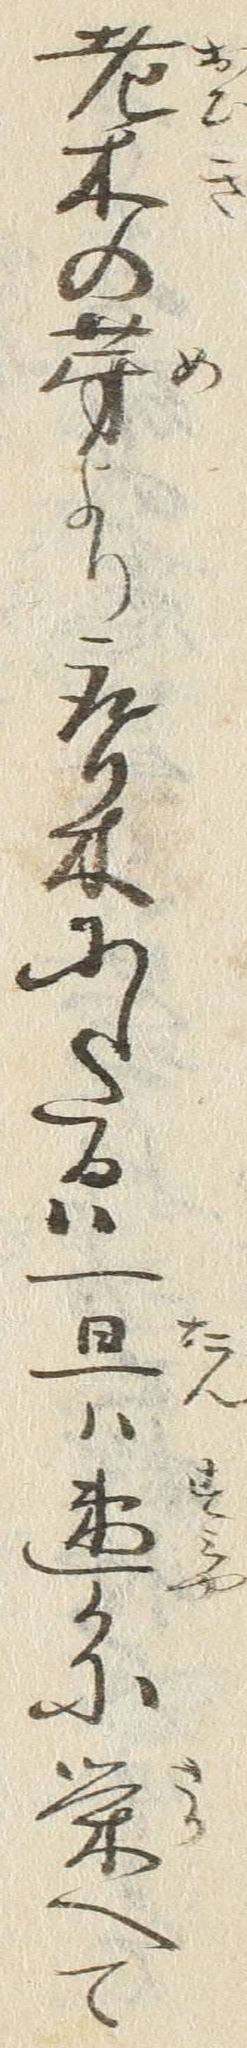老木の芽より取り木尓したるは一旦は速か尓栄へて
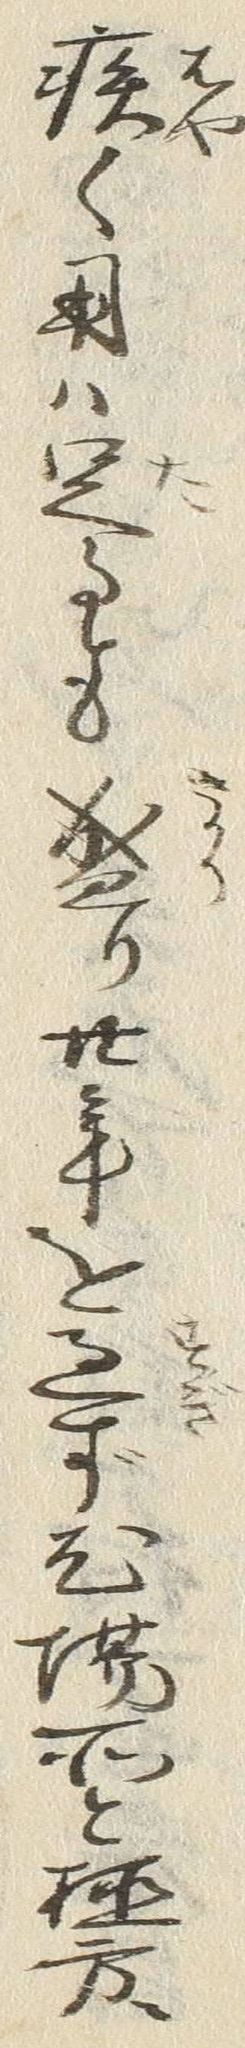疾く用は足るとも盛り廿年を過ず尤場所と植方に
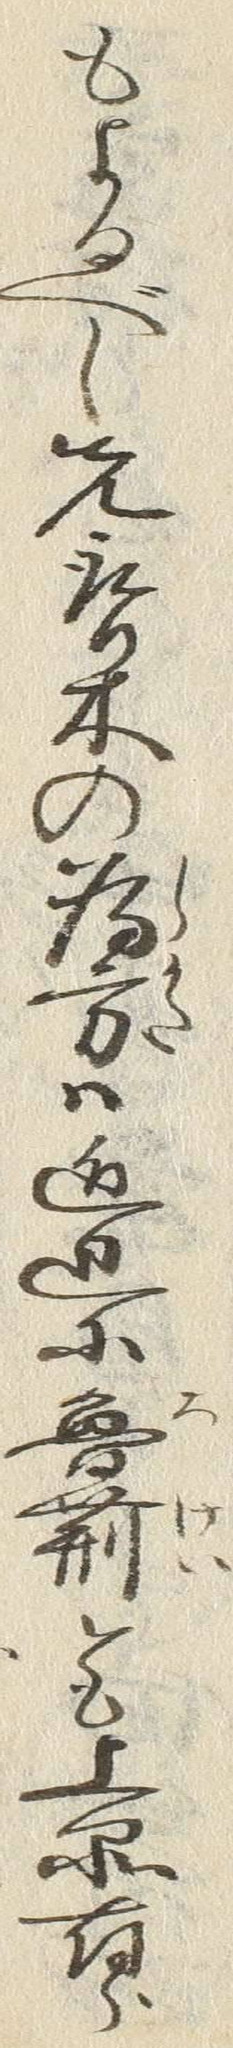もよるべし先取り木の為方は近辺尓魯荊とも上品有ら
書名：養蠶實驗録後編
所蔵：東京大学農学生命科学図書館 国文学研究資料館
